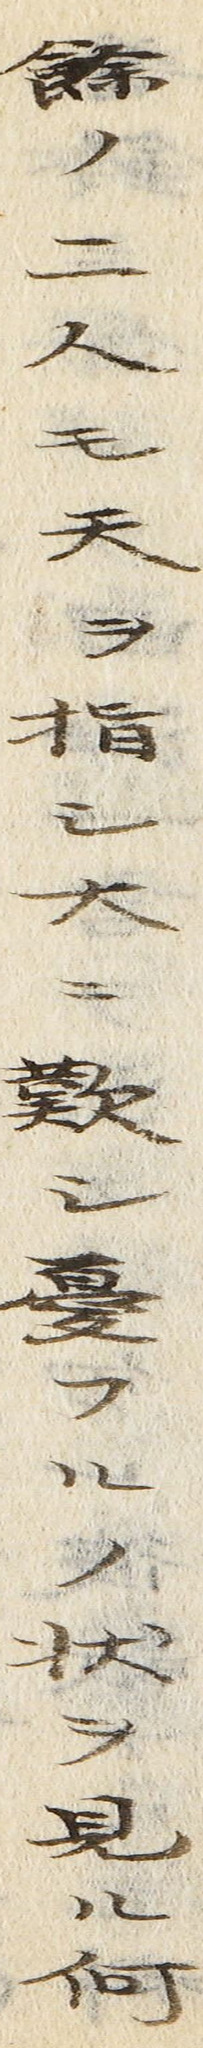余ノ二人モ天ヲ指シ大ニ歎シ憂フルノ状ヲ見ル何
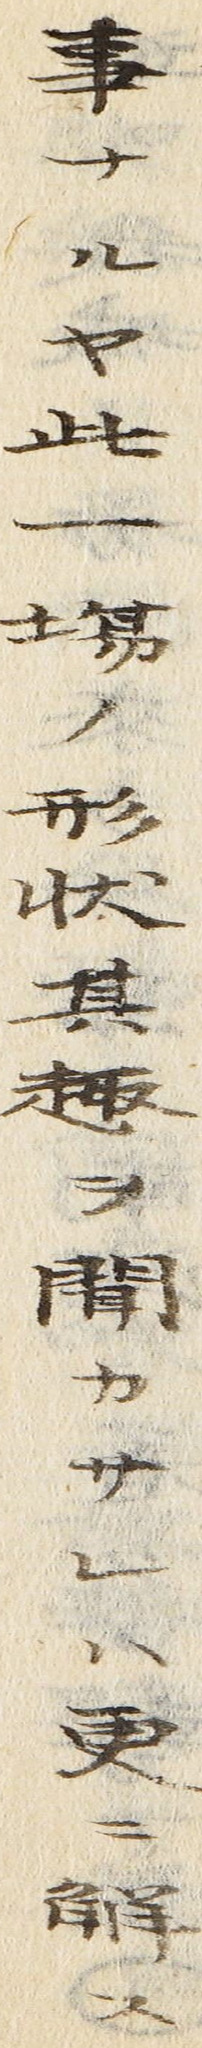事ナルヤ此一場ノ形状其趣ヲ聞カサレハ更ニ解ス
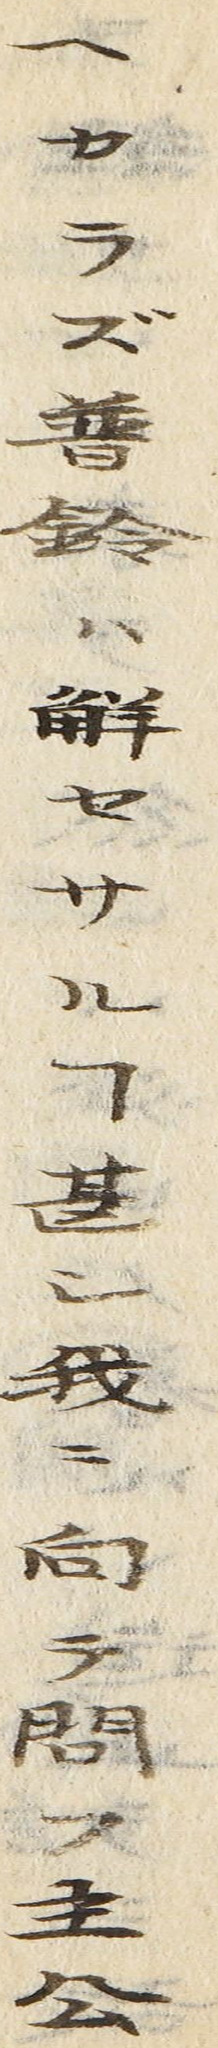ヘカラズ普鈴ハ解セサルコト甚シ我ニ向テ問フ主公
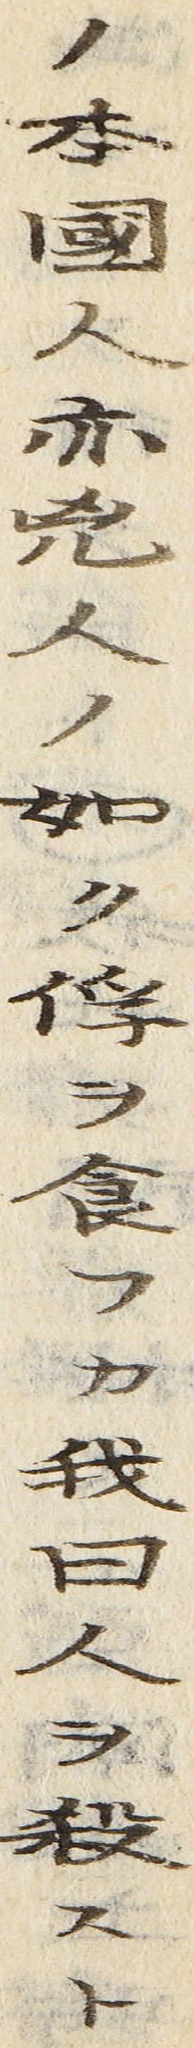ノ本国人亦兇人ノ如ク俘ヲ食フカ我曰人ヲ殺スト
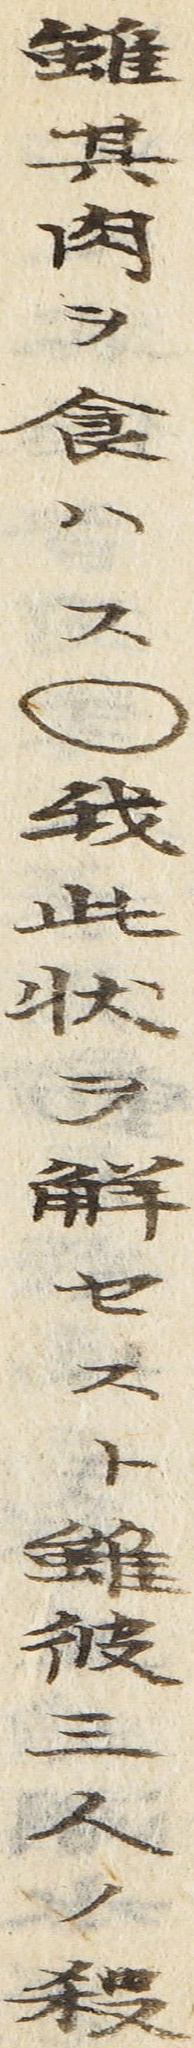雖其肉ヲ食ハス◯我此状ヲ解セスト雖彼三人ノ殺
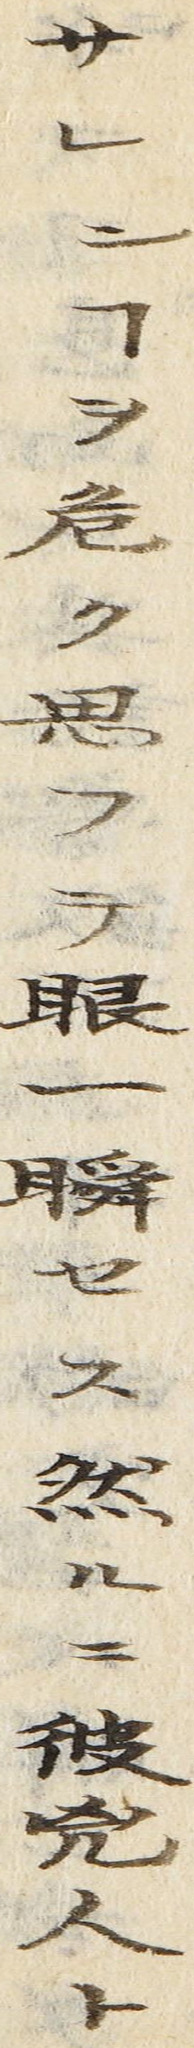サレンコトヲ危ク思フテ眼一瞬セス然ルニ彼兇人ト
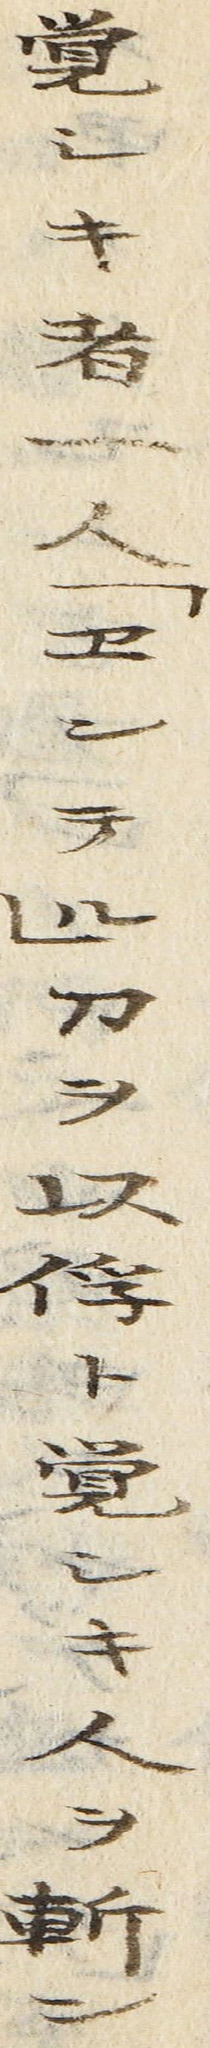覚シキ者一人「ヱンテル」刀ヲ以俘ト覚シキ人ヲ斬ン
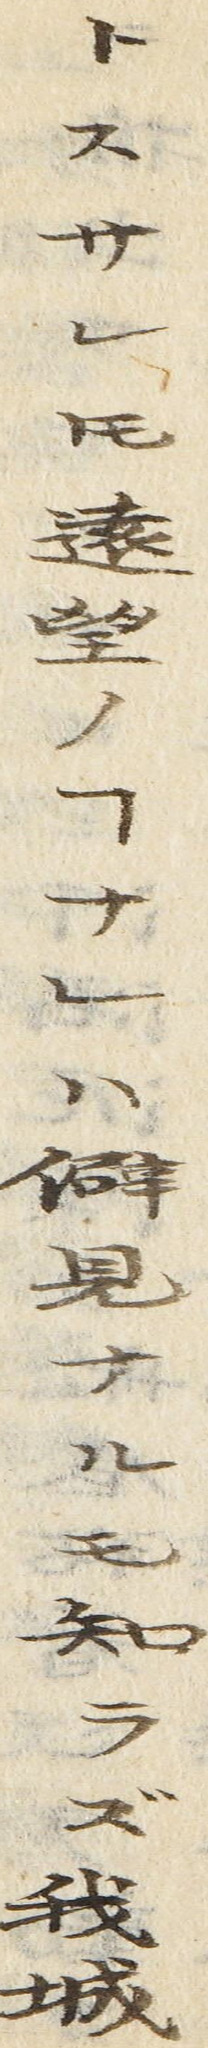トスサレトモ遠望ノコトナレハ僻見ナルモ知ラズ我城
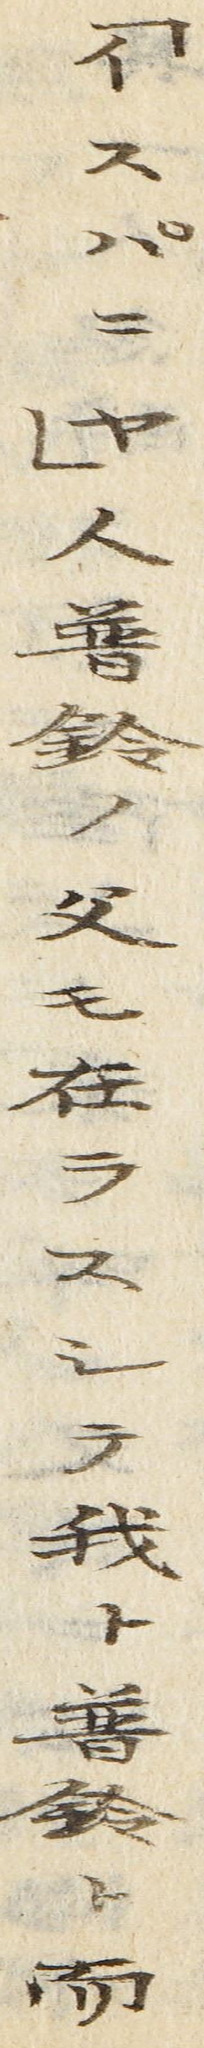「イスパニヤ」人普鈴ノ父モ在ラスシテ我ト普鈴ト而
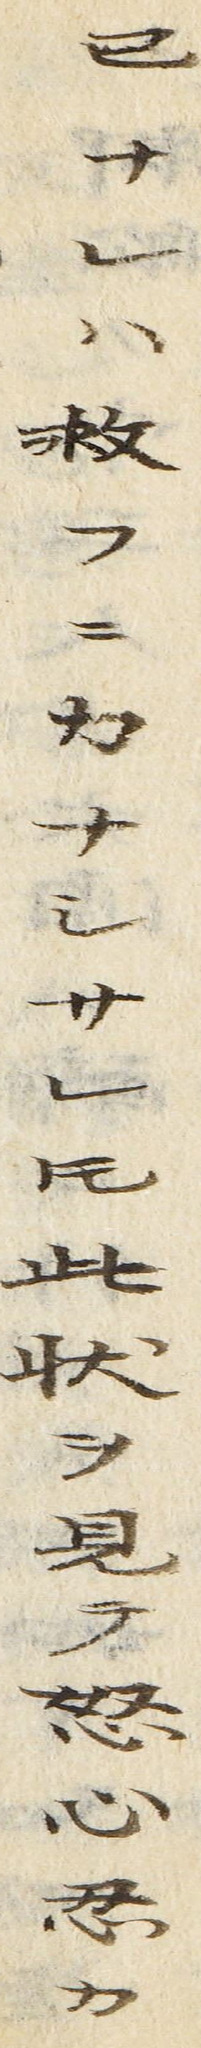已ナレハ救フニ力ナシサレトモ此状ヲ見テ怒心忍カ
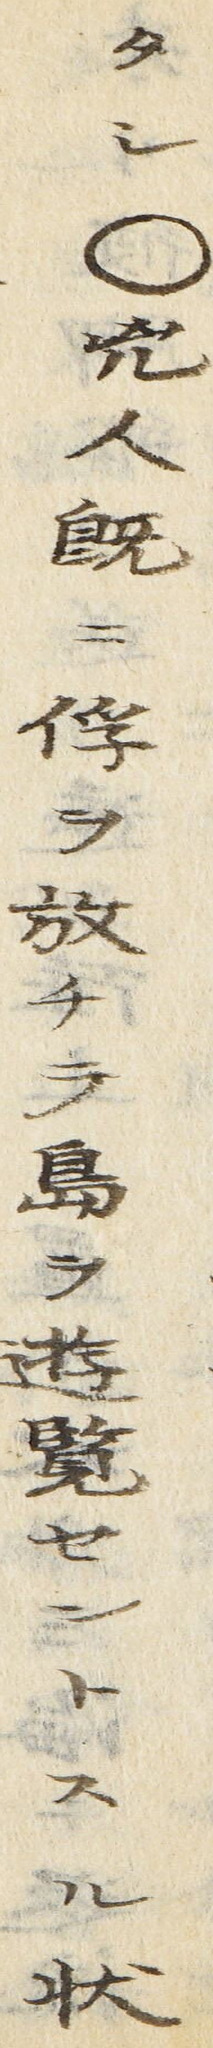タシ◯兇人既ニ俘ヲ放チテ島ヲ遊覧セントスル状
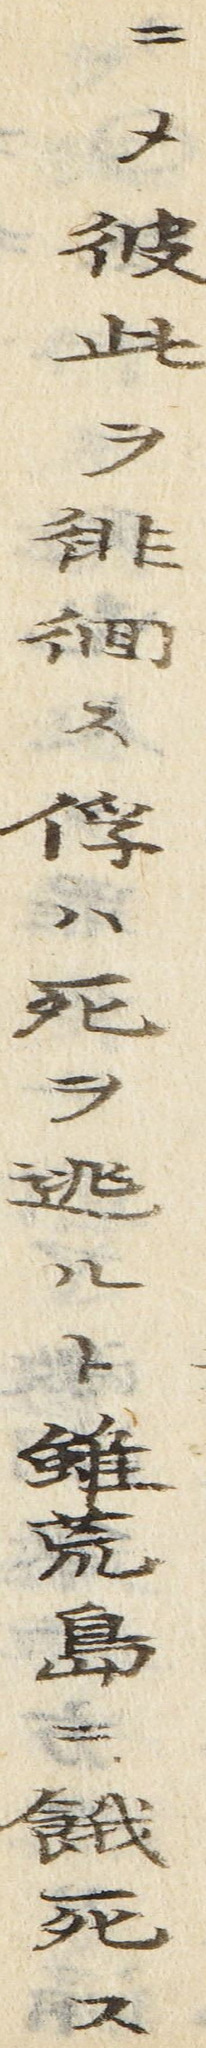ニシテ彼此ヲ徘徊ス俘ハ死ヲ逃ルト雖荒島ニ飢死ス
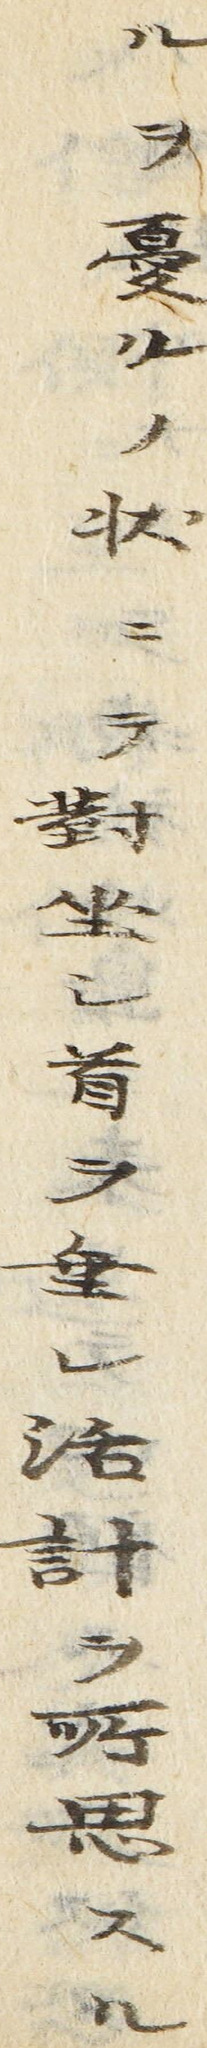ルヲ憂ルノ状ニテ対坐シ首ヲ垂レ活計ヲ所思スル

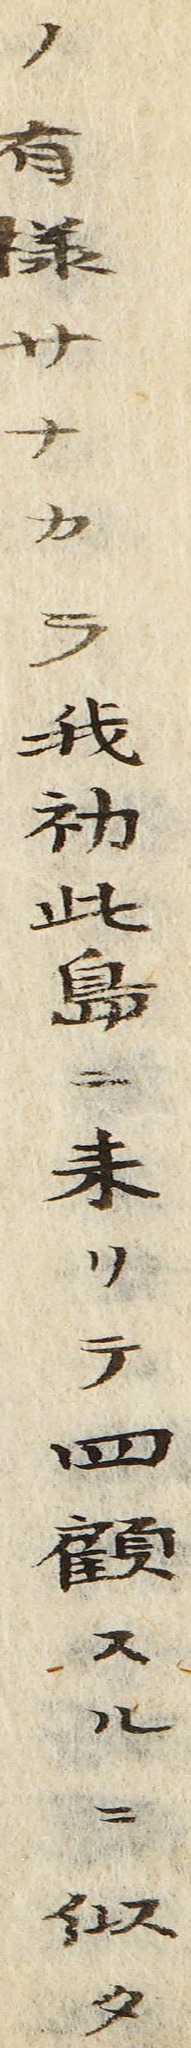ノ有様サナカラ我初此島ニ来リテ四顧スルニ似タ
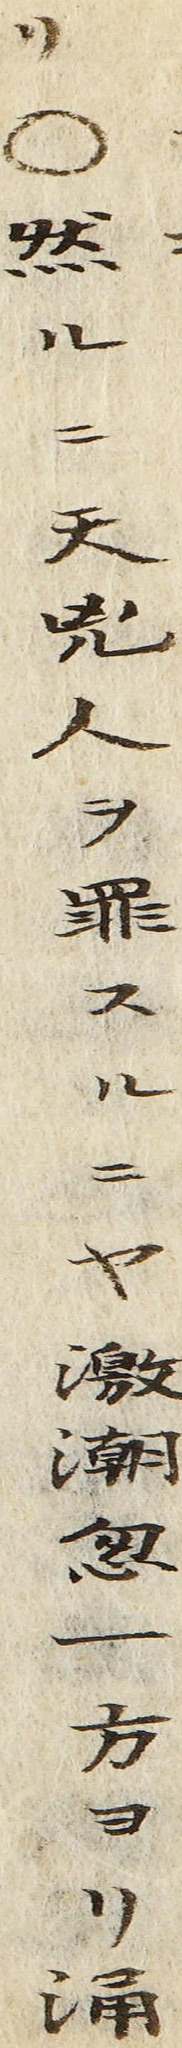リ◯然ルニ天兇人ヲ罪スルニヤ激潮忽一方ヨリ涌
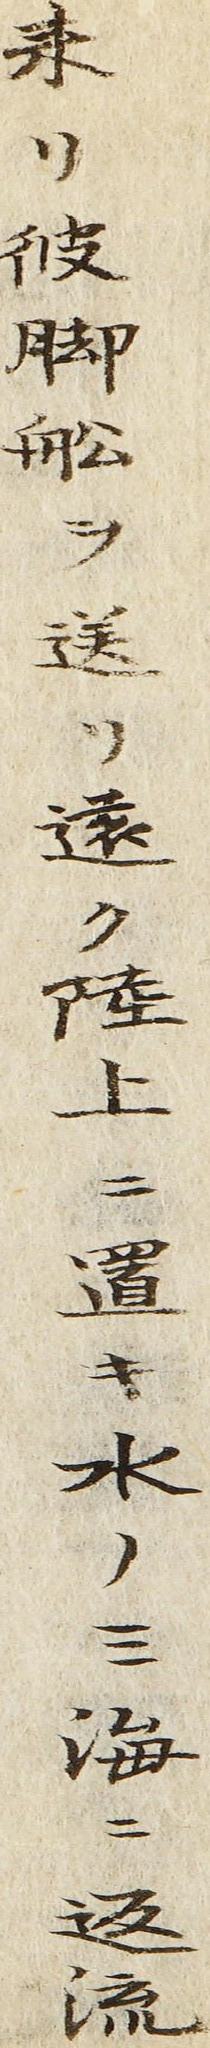来リ彼脚船ヲ送リ遠ク陸上ニ置キ水ノミ海ニ返流
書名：漂流紀事
